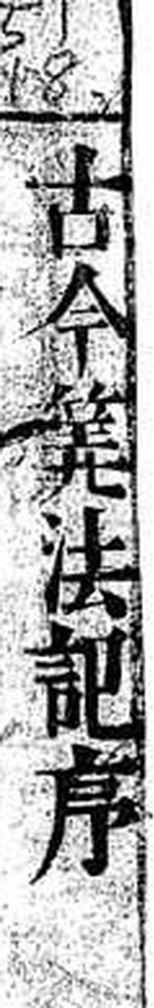古今算法記序
